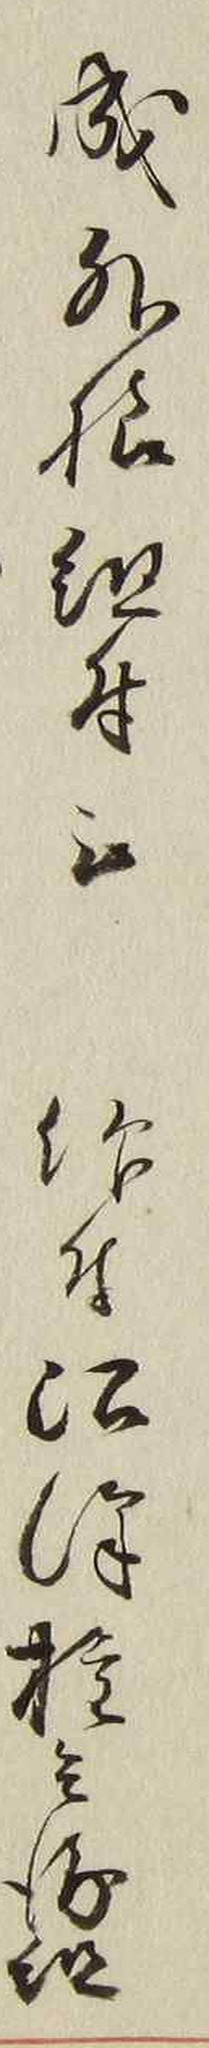成外様組付被仰付沼沢権兵衛組
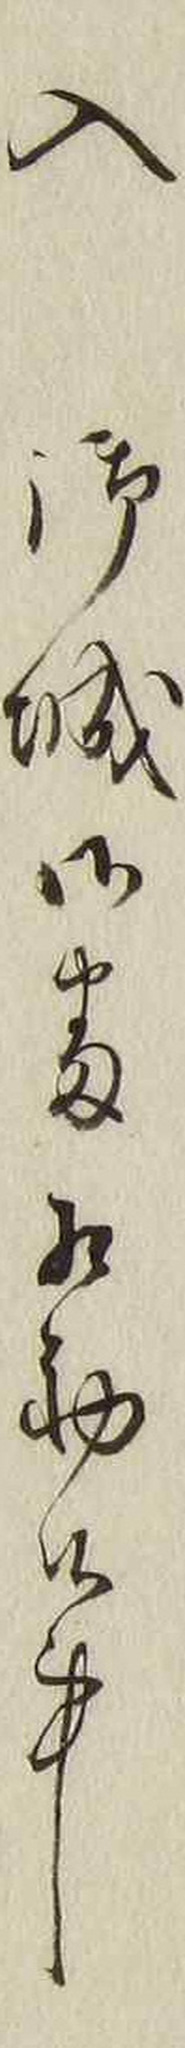入御城御番相勤候事
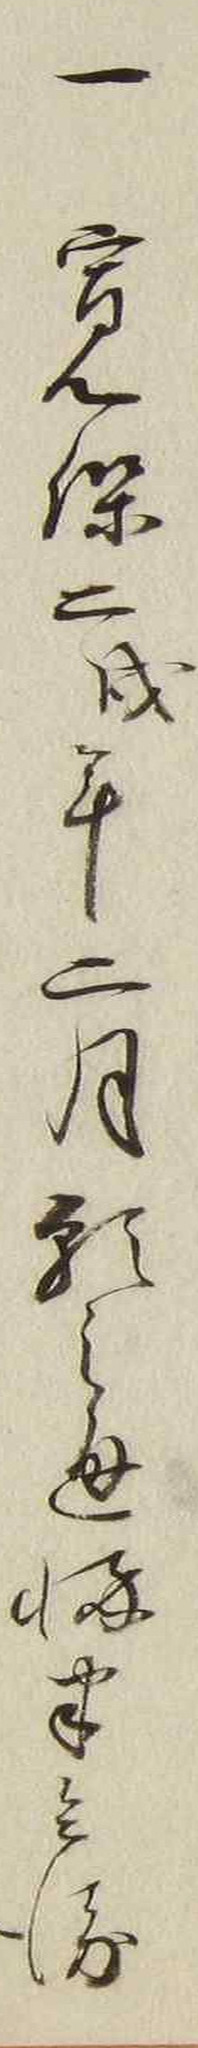一寛保二戌年二月願之通忰半兵衛

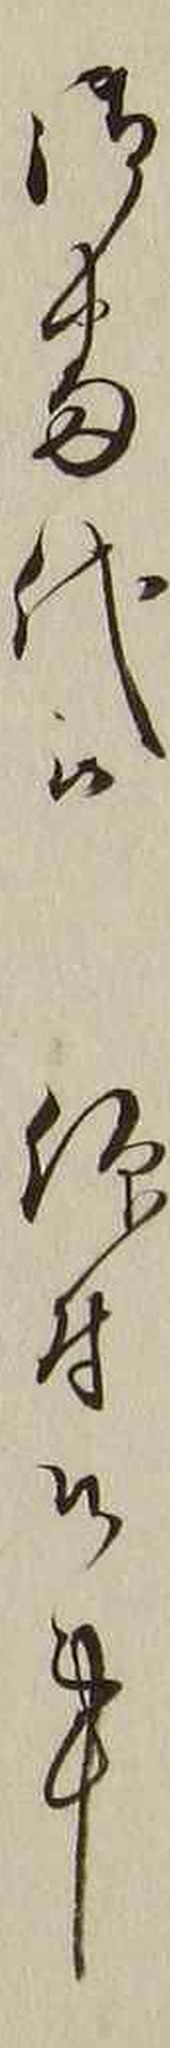御番代被仰付候事
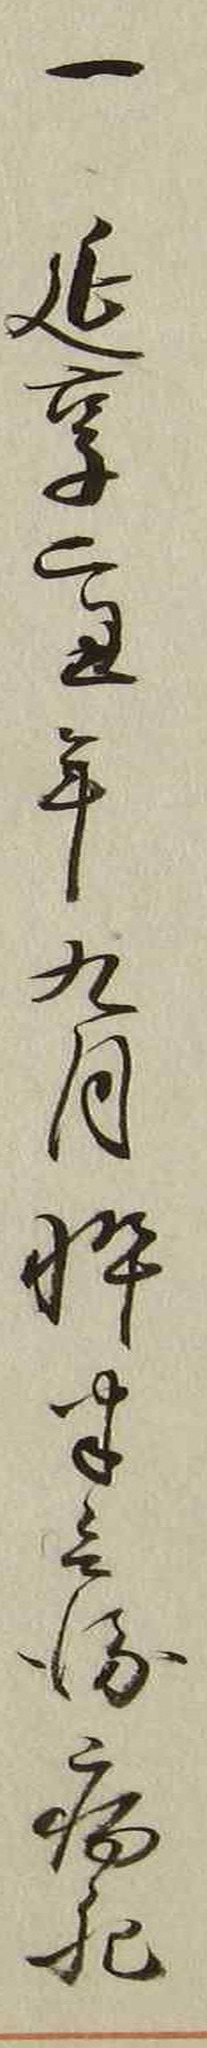一延享二丑年九月忰半兵衛病死
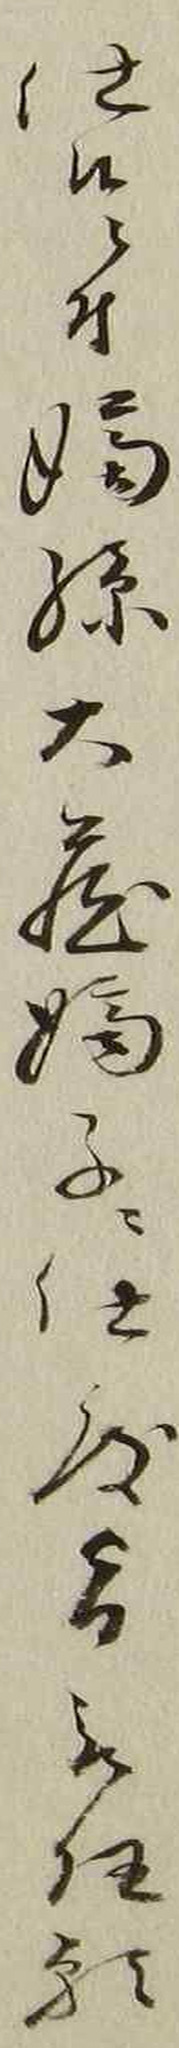仕候ニ付嫡孫大蔵嫡子ニ仕度旨被任願
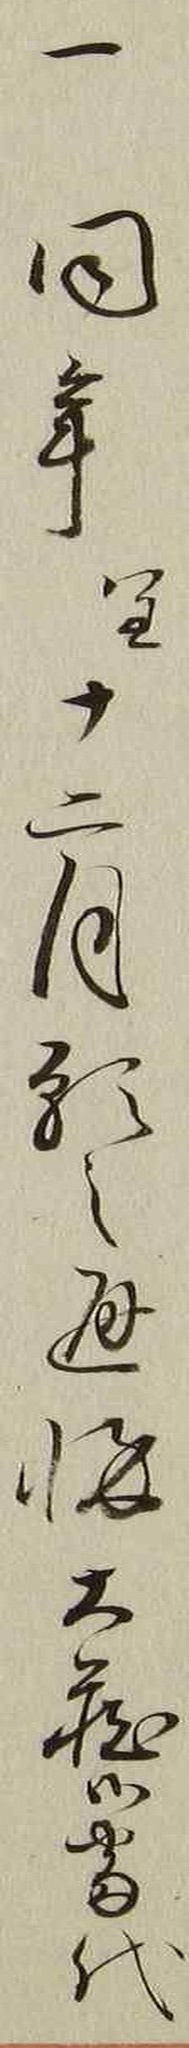一同年閏十二月願之通忰大蔵御番代
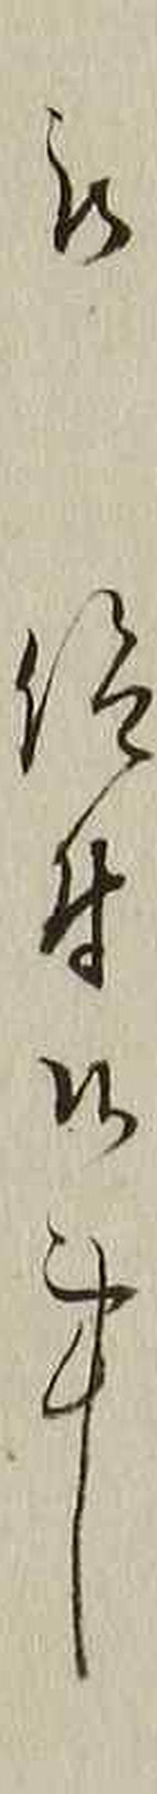被仰付候事
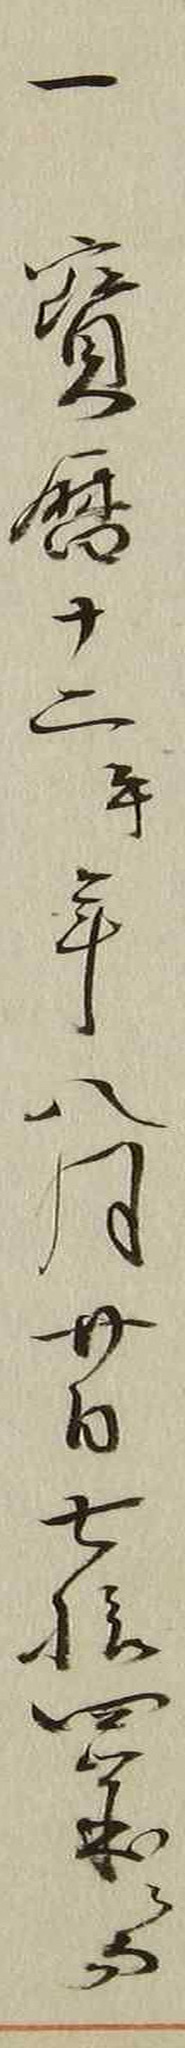一宝暦十二午年八月廿日七拾四歳ニ而
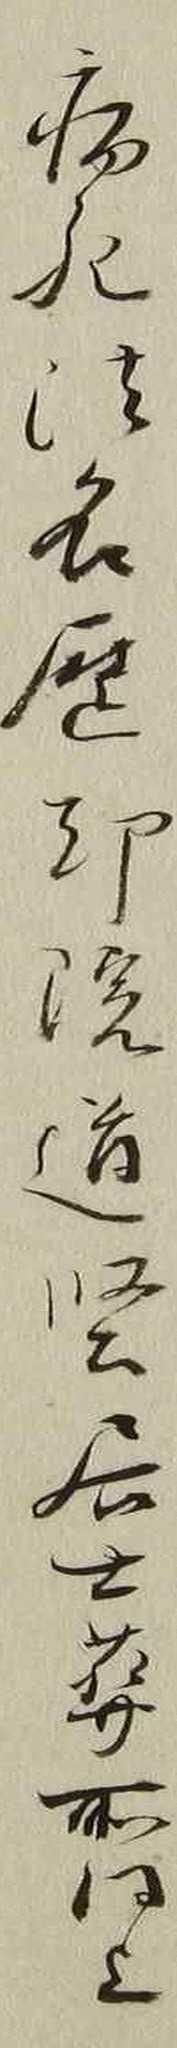病死法名歴却院道堅居士葬所同上
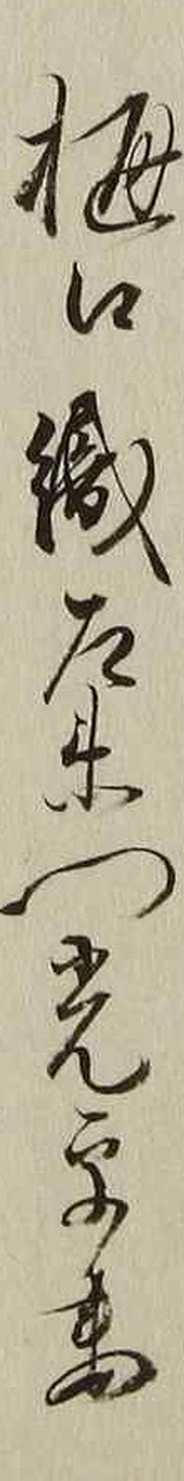女樋口織左衛門光更妻
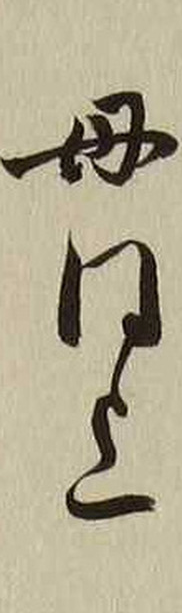母同上
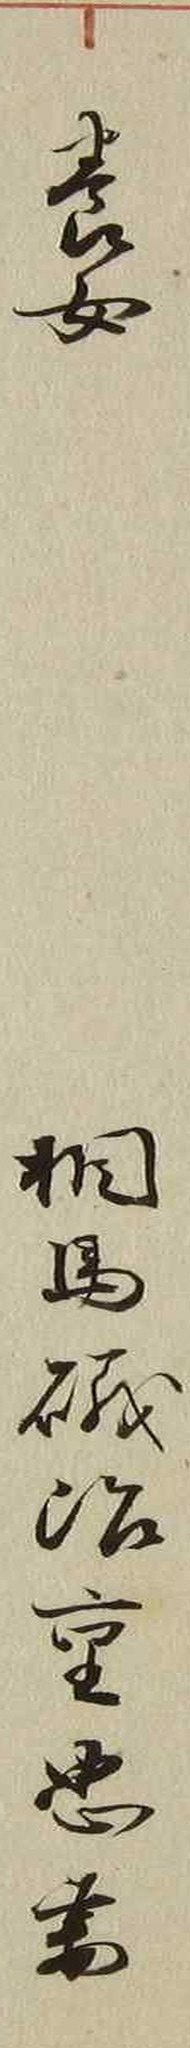養女相馬磯治重忠妻
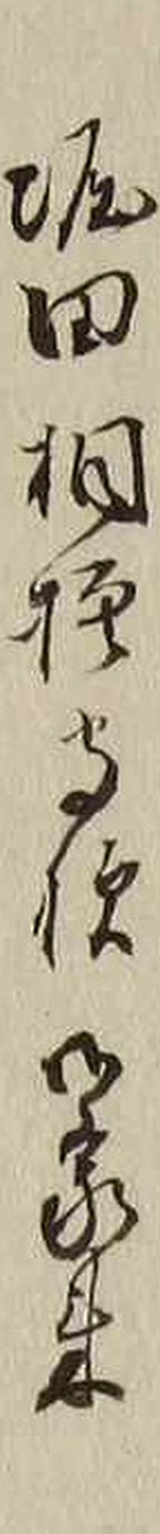堀田相模守様御家来
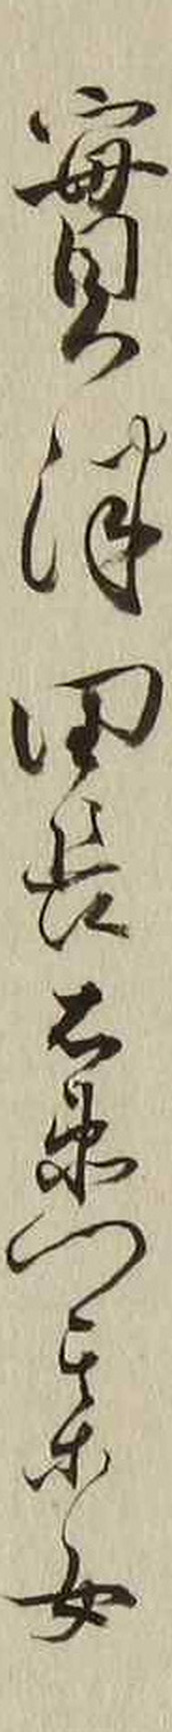実津田長右衛門某女
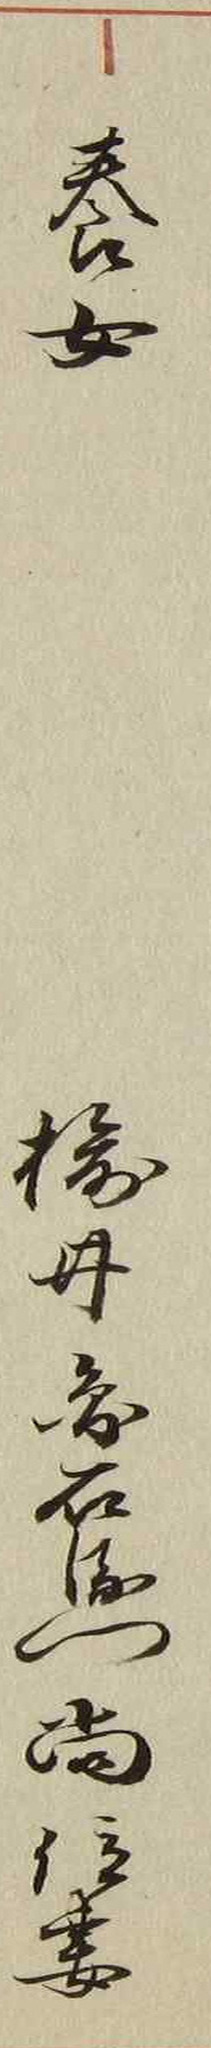養女楡井円右衛門尚信妻
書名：諸士系譜　巻之26　い之部26
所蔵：会津若松市立会津図書館
